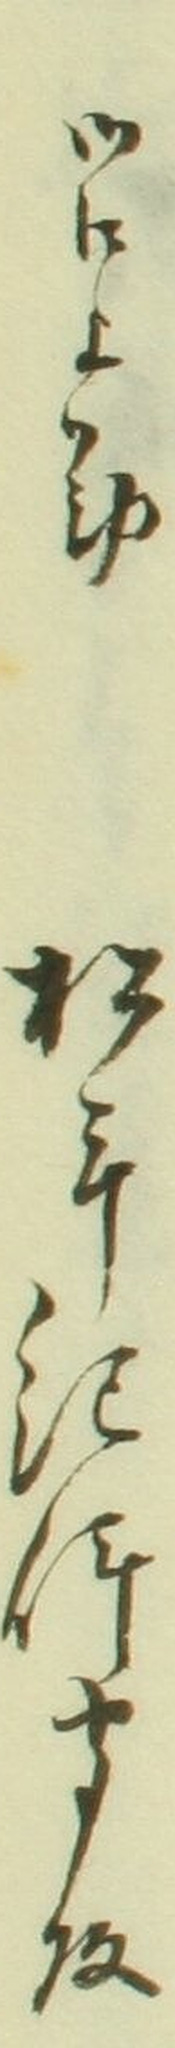御口上勤松平紀伊守殿
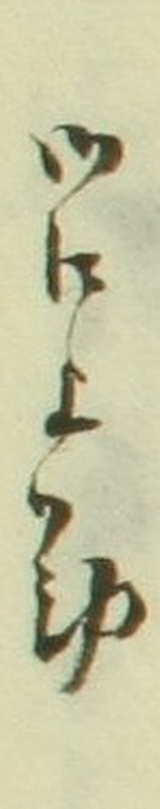御口上分
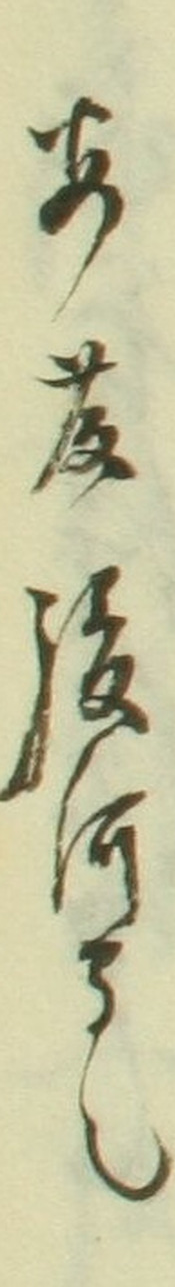安藤駿河守殿

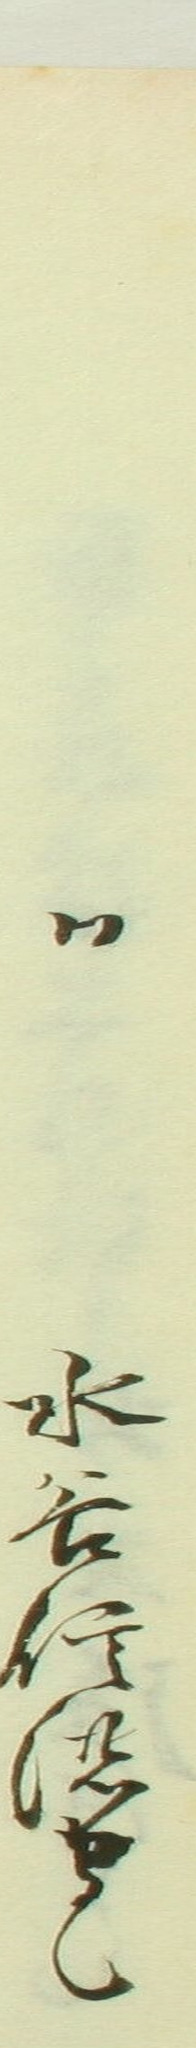同水谷信濃守殿
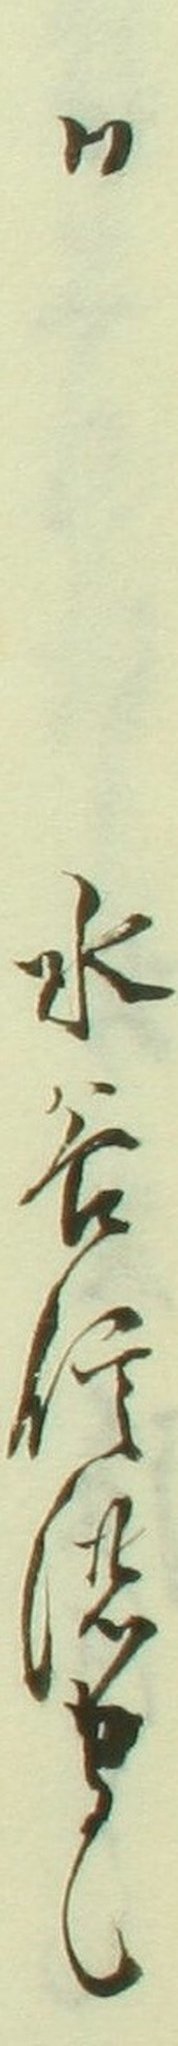同水谷信濃守殿
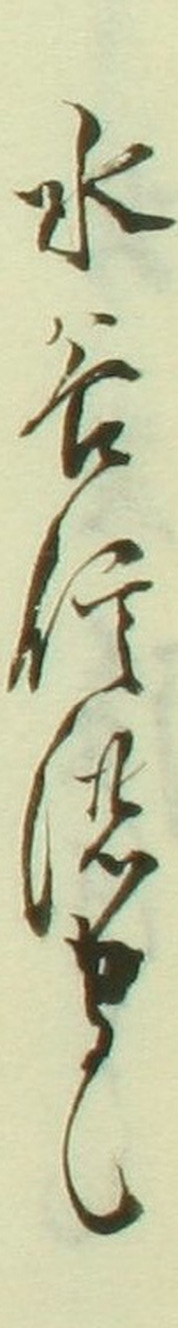同水谷信濃守殿
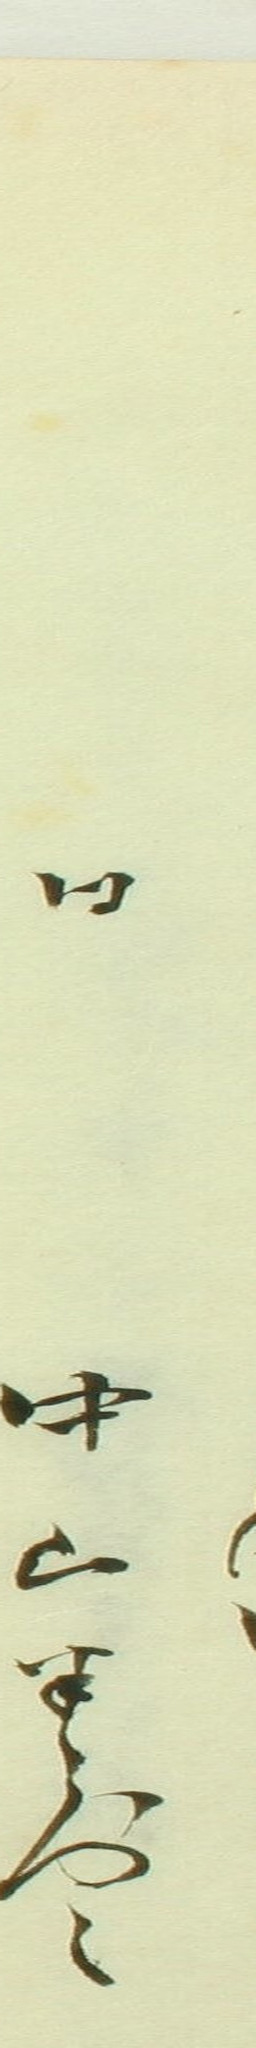同中山半右衛門殿
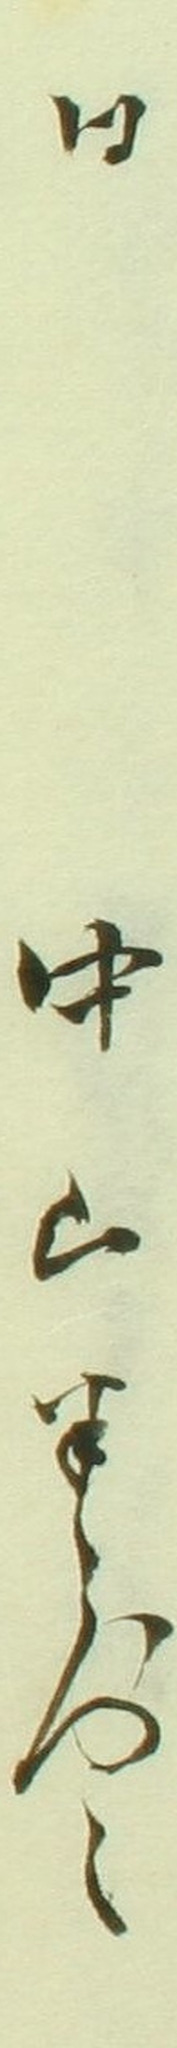同中山半右衛門殿
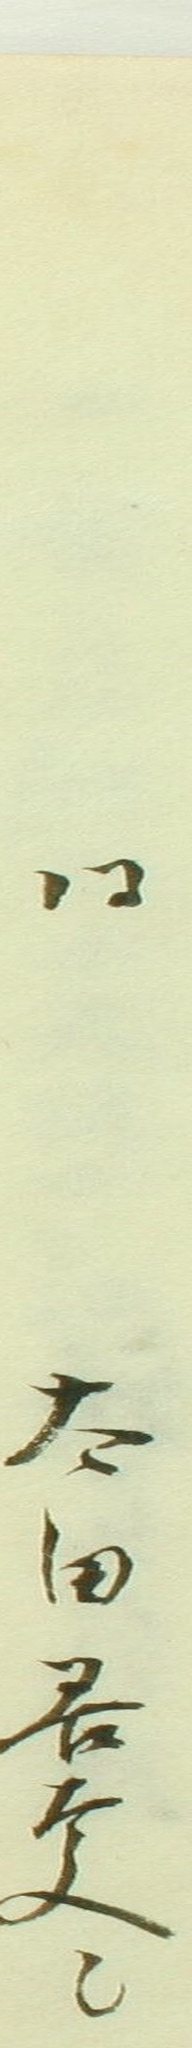同太田善太夫殿
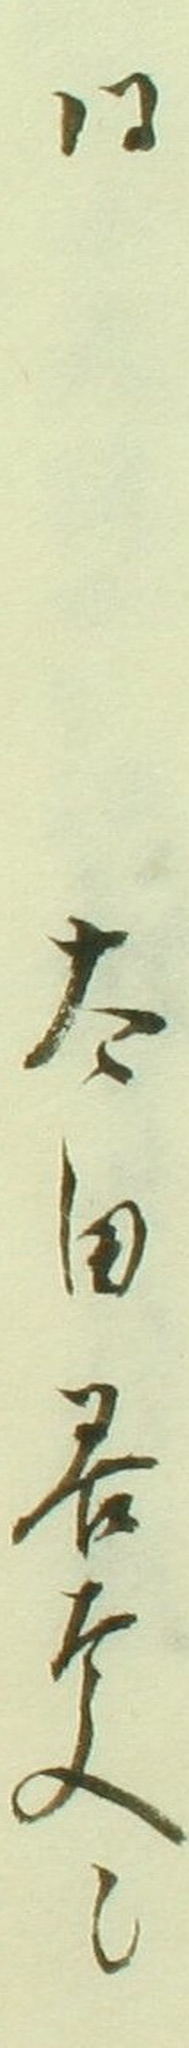同太田善太夫殿
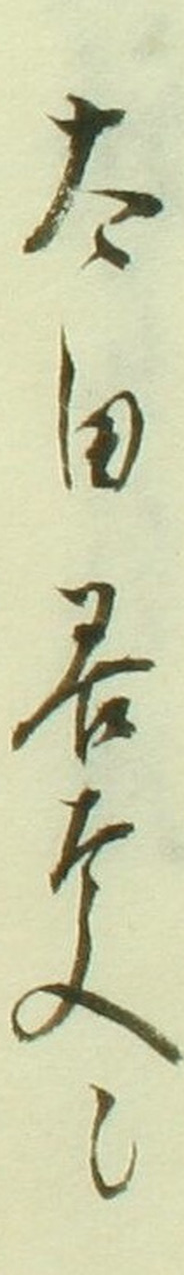同太田善太夫殿
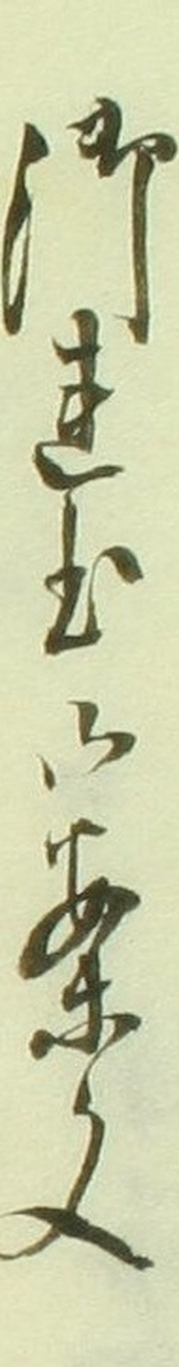御連書御案文
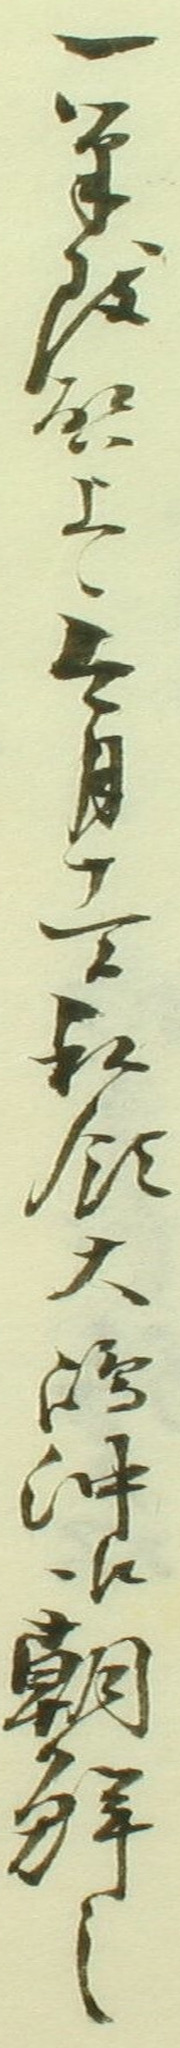一筆致啓上候今月十一日私領大嶋沖江朝鮮之
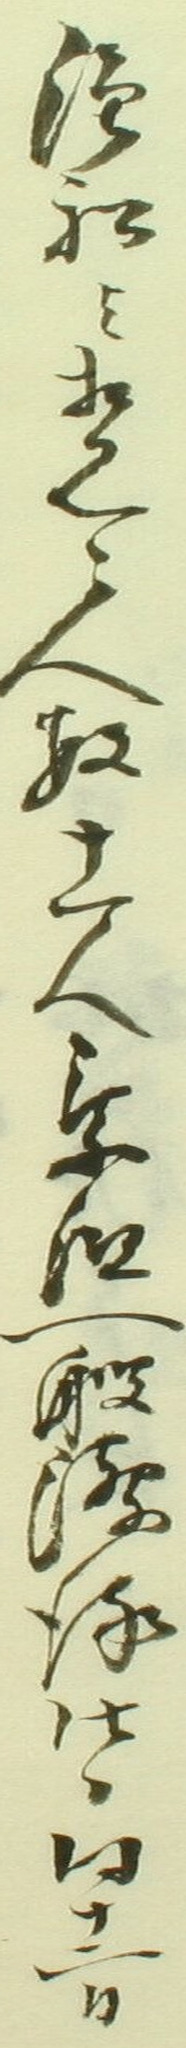漁船と相見候人数十一人乗組一艘漂流仕候同十二日
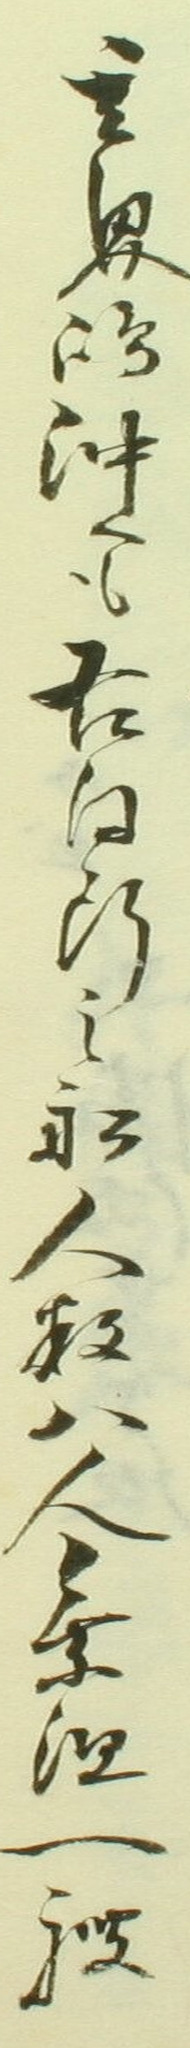玄界嶋沖へも右同断之船人数八人乗組一艘
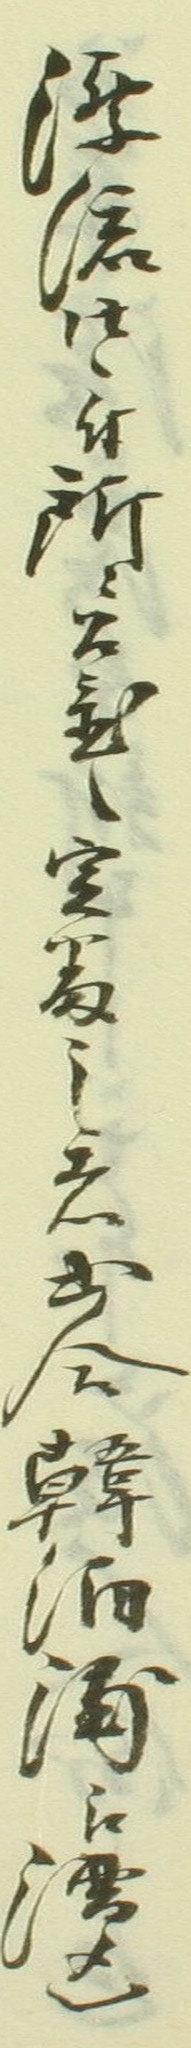漂流仕候付所ニ召置候定番之者出合韓泊浦江漕込
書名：異国船漂着記
